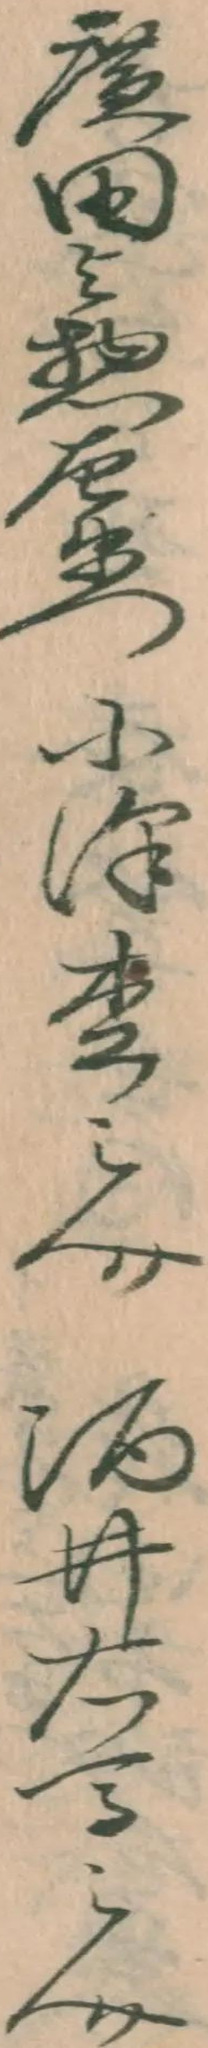廣田与惣左衛門小沢杢之助酒井右馬之介
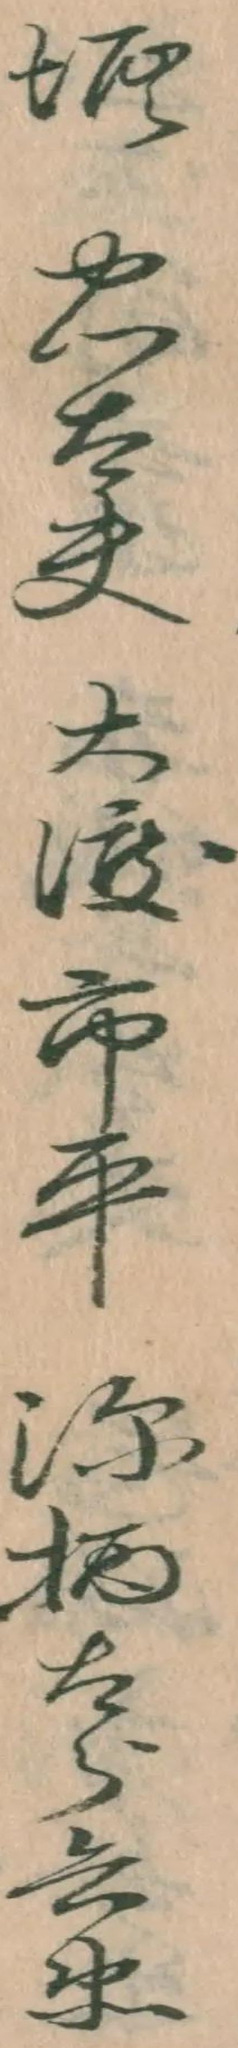堀忠太夫大渡市平沢柄太郎兵衛
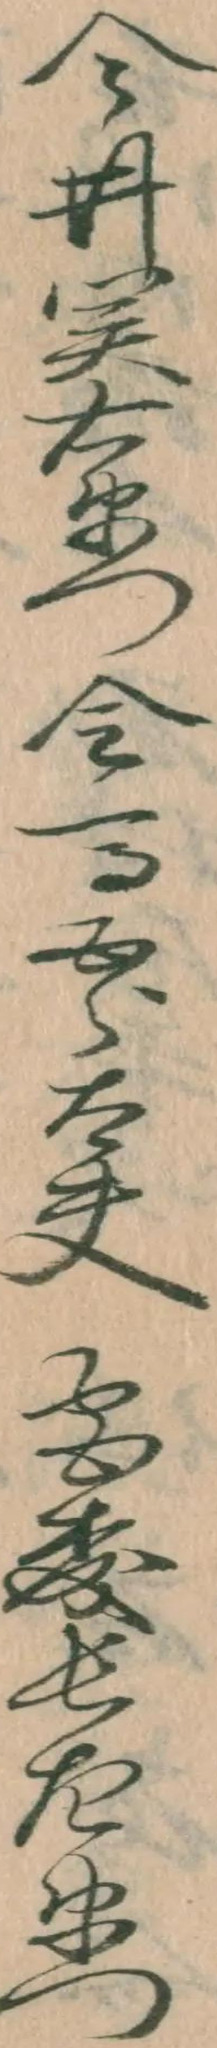今井関右衛門金馬五郎太夫宮森長左衛門
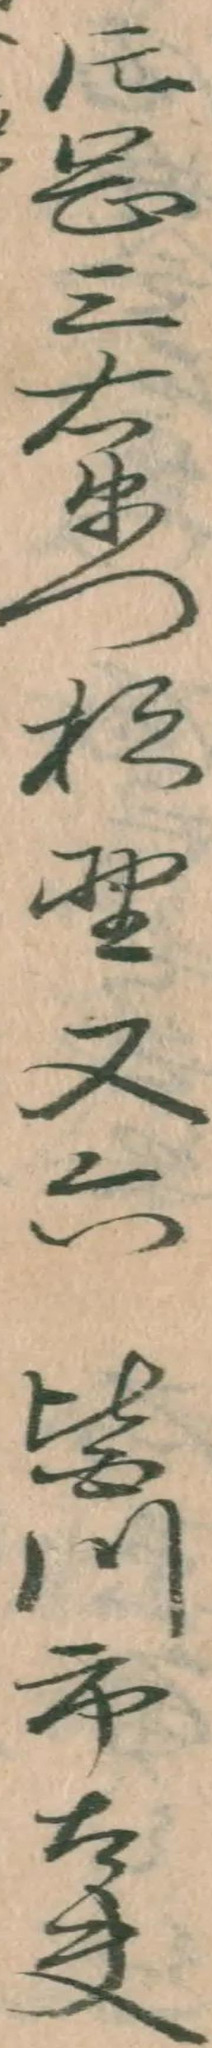片岡三右衛門杉野又六皆川市太夫
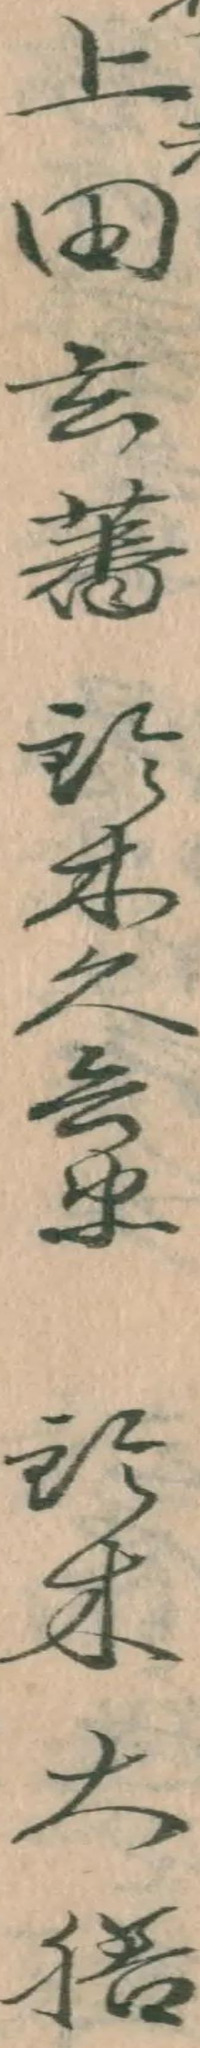上田玄蕃鈴木久兵衛鈴木大膳
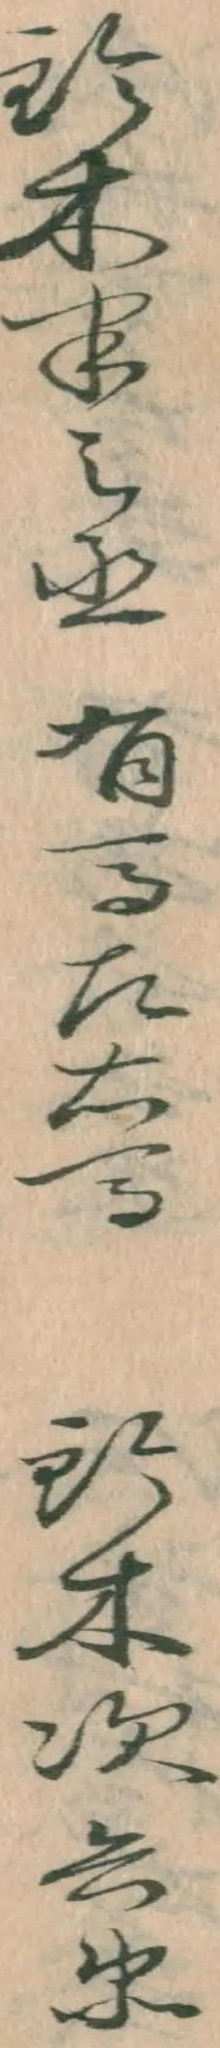鈴木伴之丞有馬左右馬鈴木次兵衛
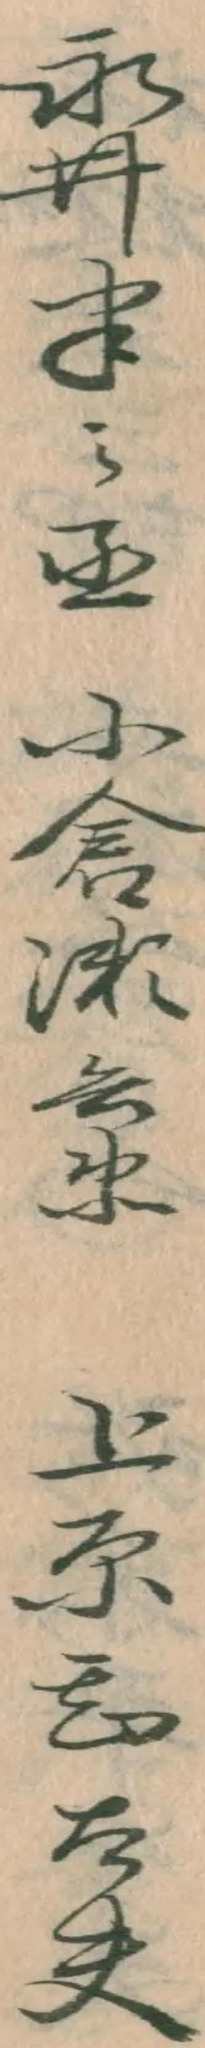永井伴之丞小倉瀬兵衛上原仁太夫
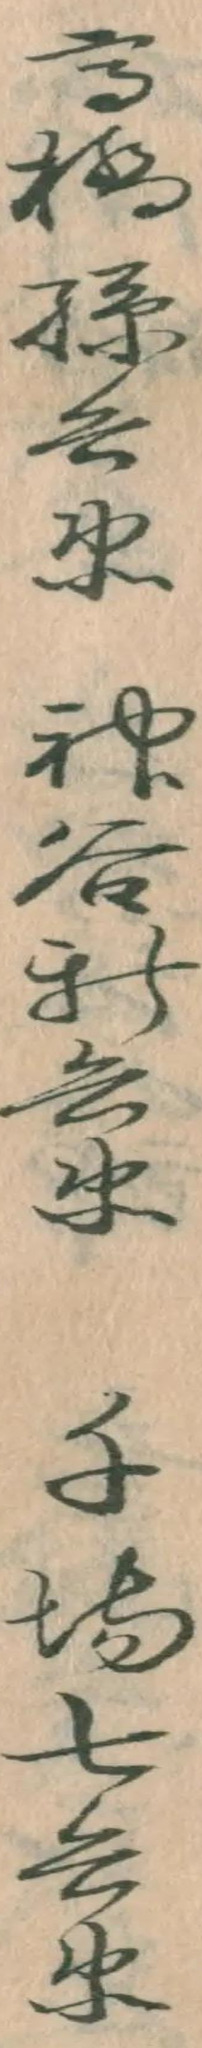高橋孫兵衛神谷新兵衛千場七兵衛
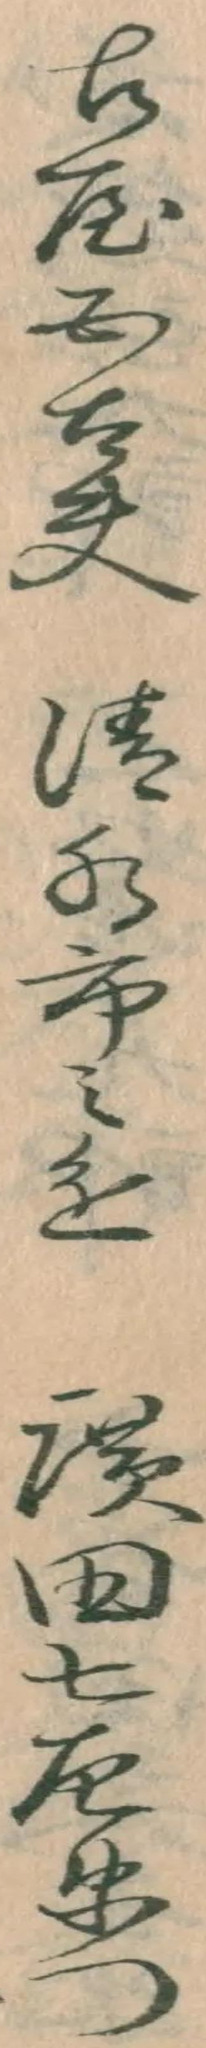古屋五太夫清水市之進福村作之丞
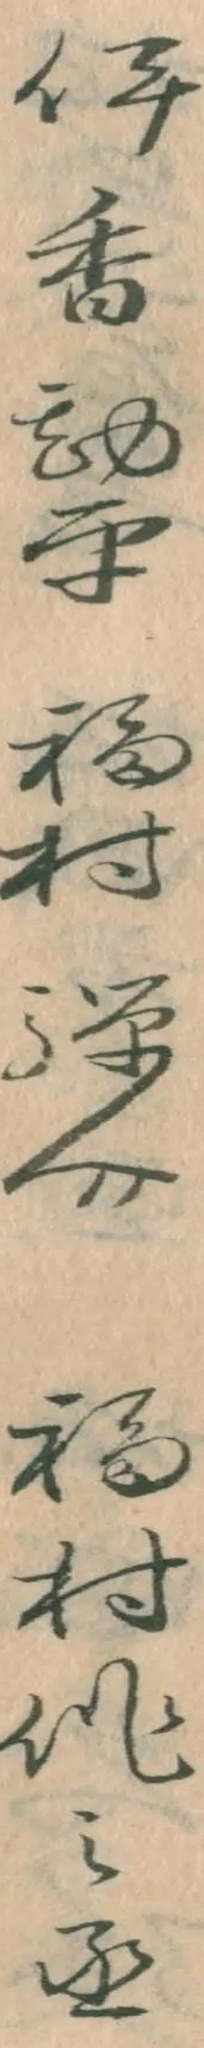伊香勘平福村弾介福村作之丞

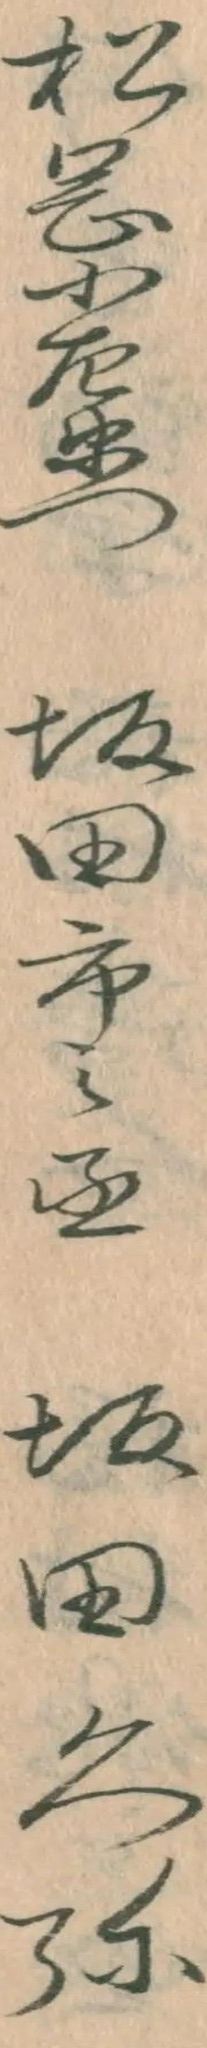松岡小左衛門坂田市之丞坂田久弥
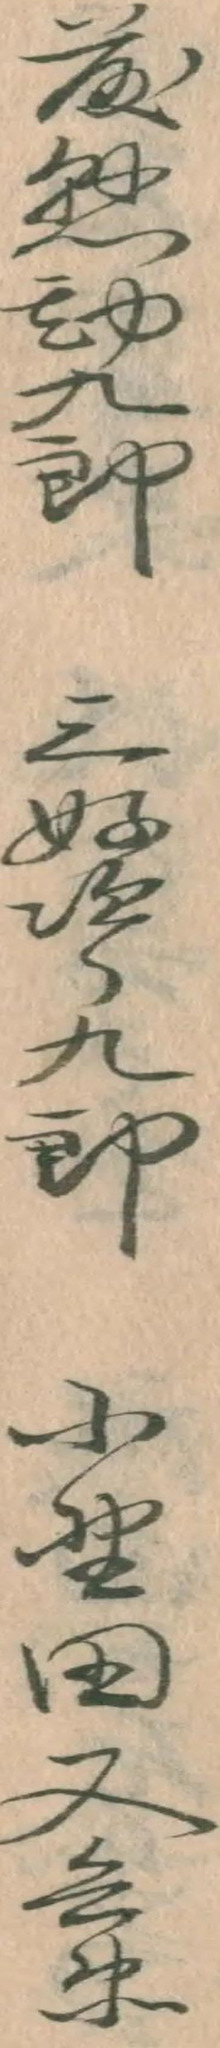藤懸勘九郎三好次郎九郎小野田又兵衛
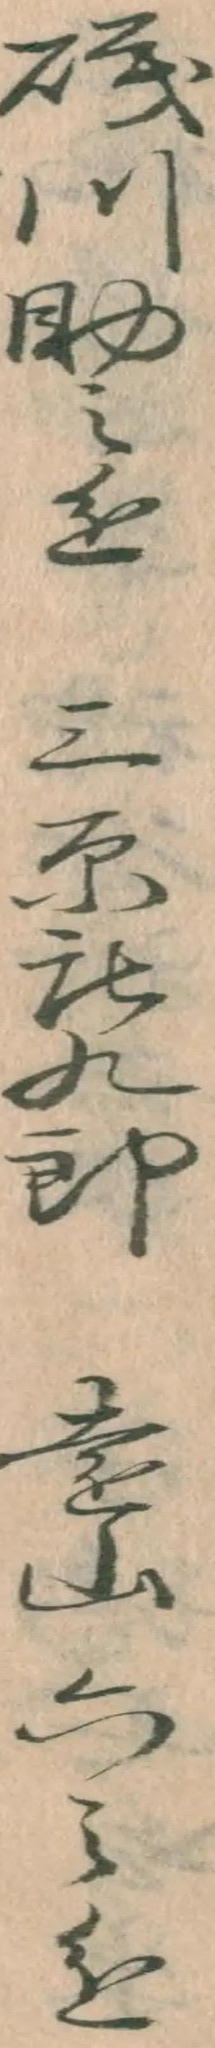磯川助之進三原庄九郎遠山六之進
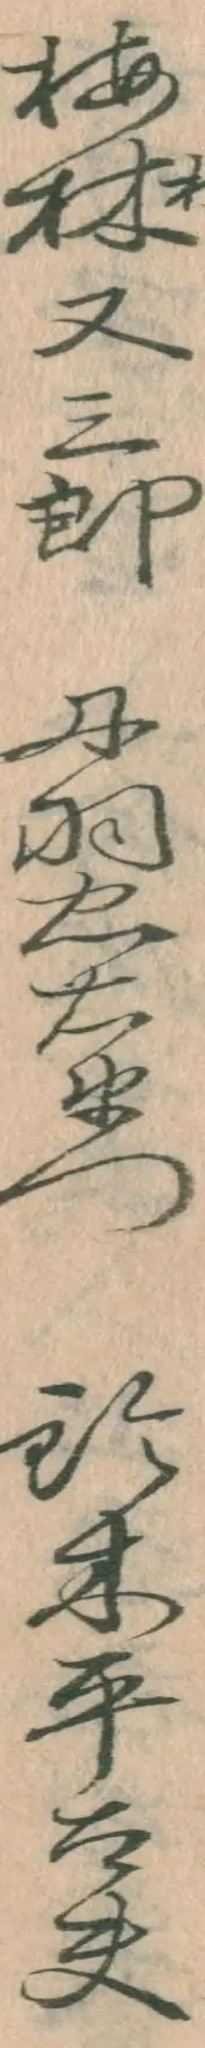梅村又三郎丹羽忠右衛門鈴木平太夫
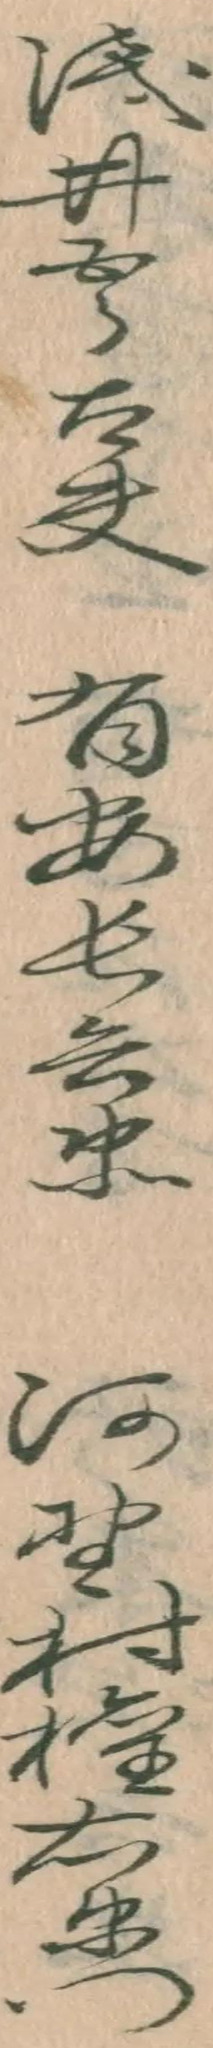浅井五郎太夫有安長兵衛河野村権右衛門
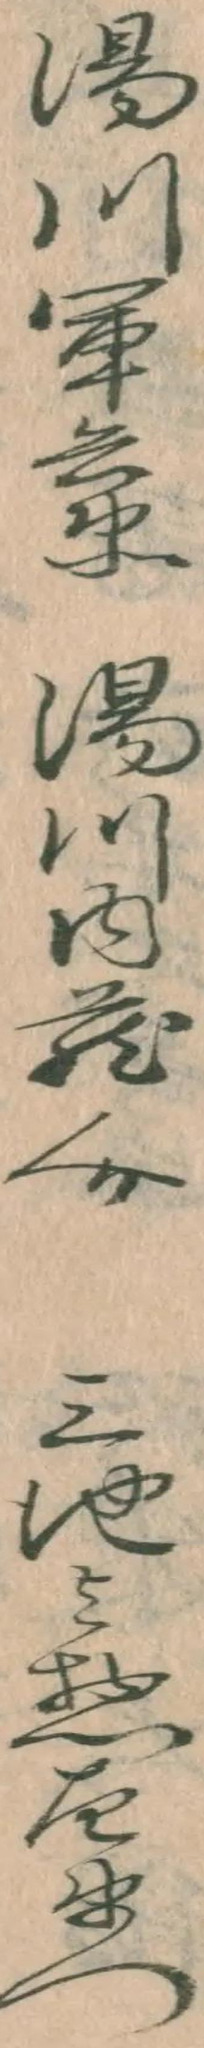湯川軍兵衛湯川内蔵介三池与惣左衛門
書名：切支丹御退治記 49巻. [9]
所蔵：国立国会図書館 National Diet Library, JAPAN
